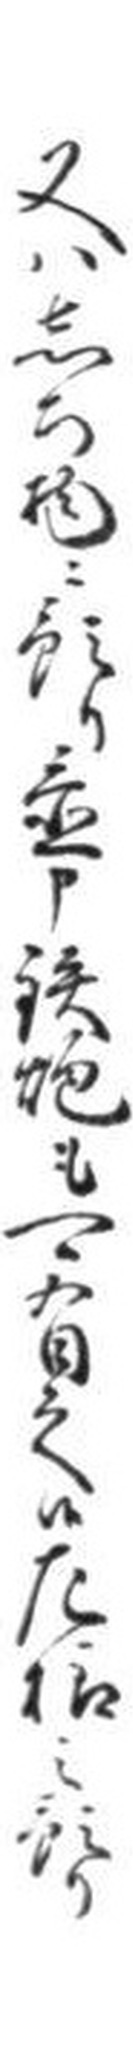又ハしち物ニ預り置鉄砲も可有之候左様之預り
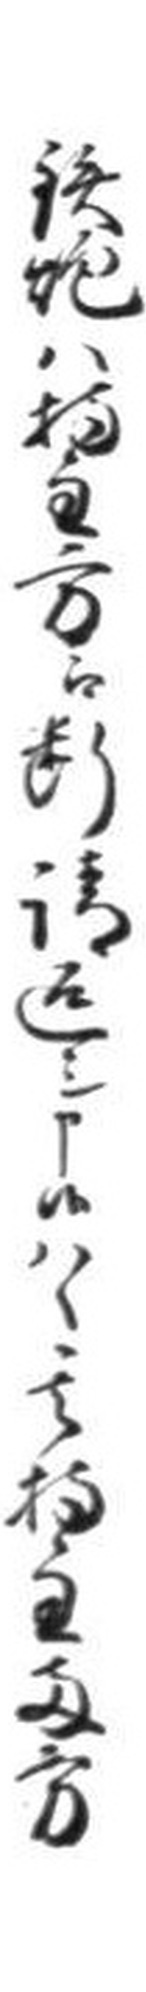鉄砲ハ持主江断請返シ申候ハヽ其持主両方
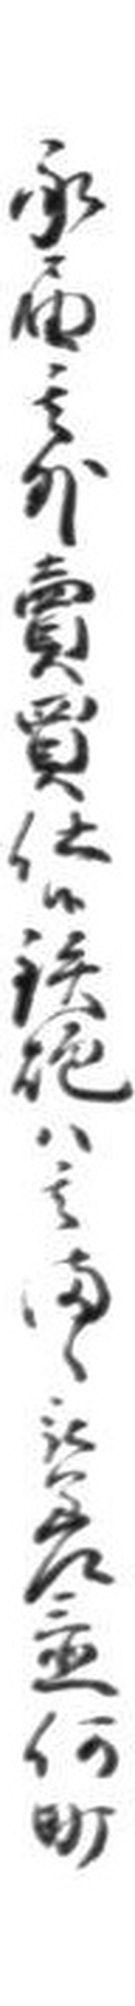承届其外売買仕候鉄砲ハ其まゝ被差置何町
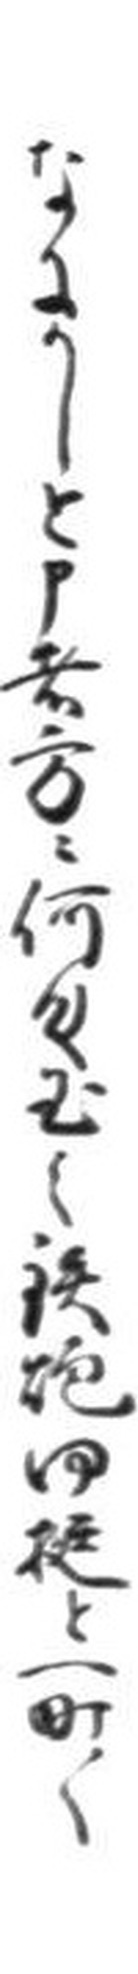なにかしと申者方ニ何匁玉之鉄砲何挺と一町〳〵
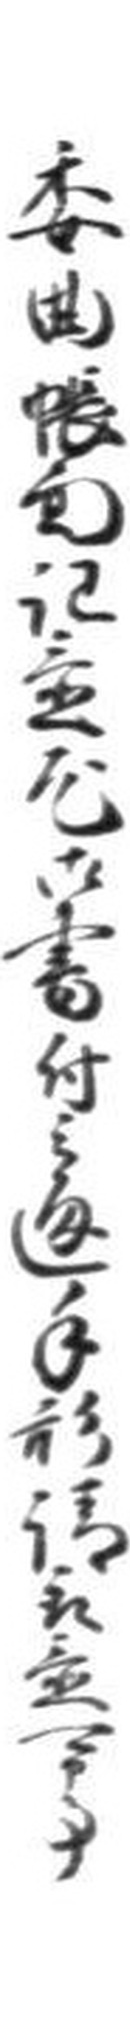委曲帳面記置尤御書付之通手形請取置可申事
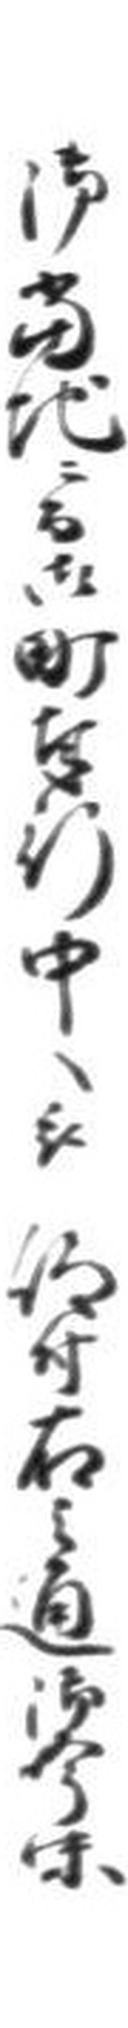御当地ニ而御町奉行中ヘ被仰付右之通御吟味
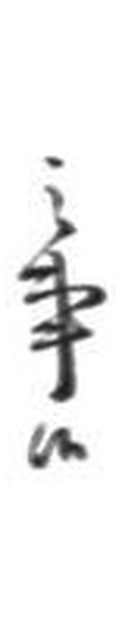之事候
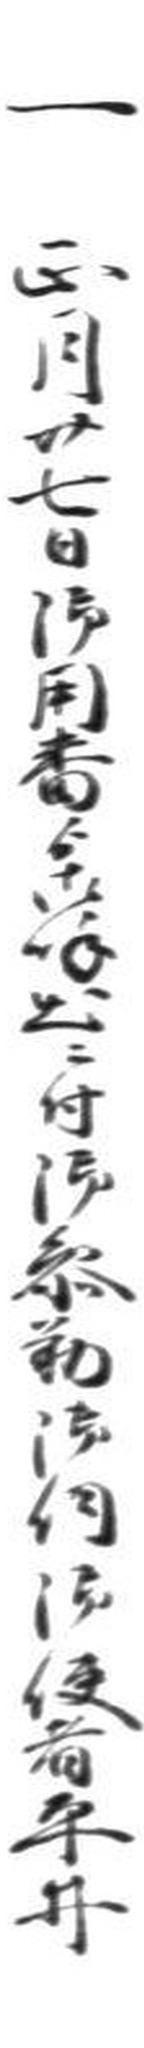一正月廿七日御用番ゟ御呼出ニ付御参勤御伺御使者平井
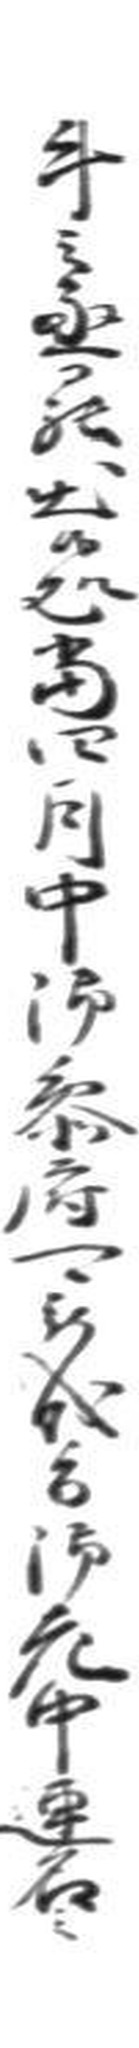牛之丞罷出候処当四月中御参府可被成旨御老中連名之

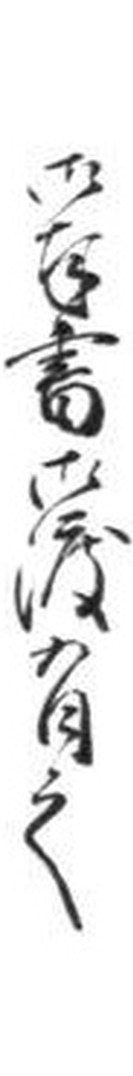御奉書御渡有之
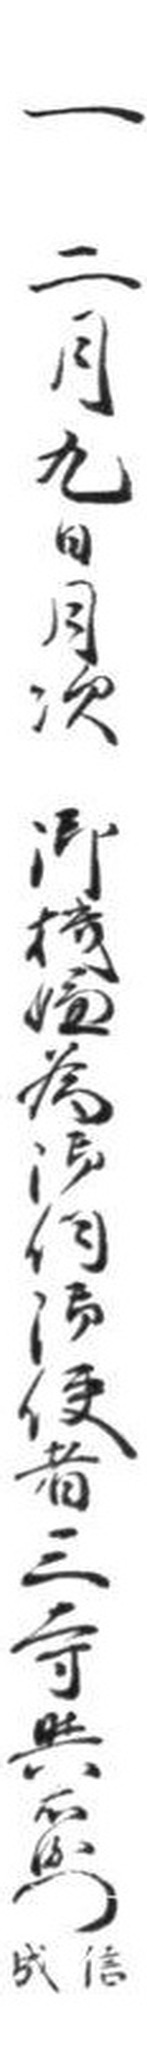一二月九日月次御機嫌為御伺御使者三寺与右衛門信成
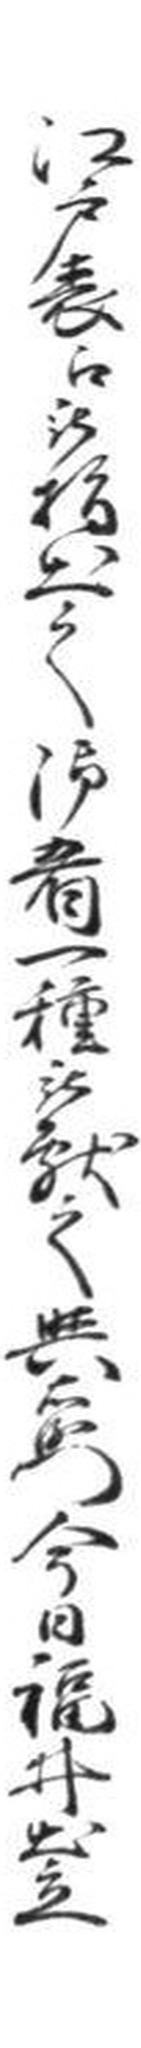江戸表江指出之御肴一種被献之与右衛門今日福井出立
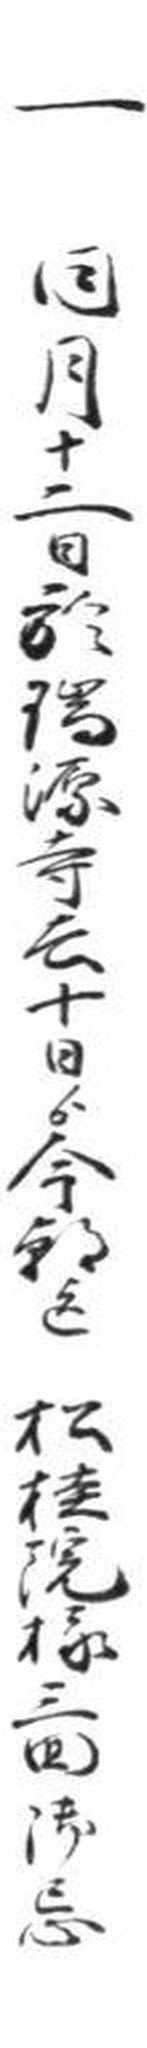一同月十二日於瑞源寺去十日ゟ今朝迄松桂院様三回御忌
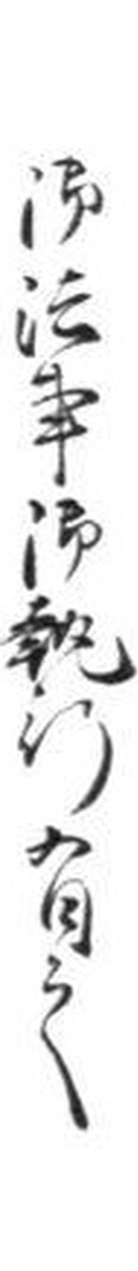御法事御執行有之
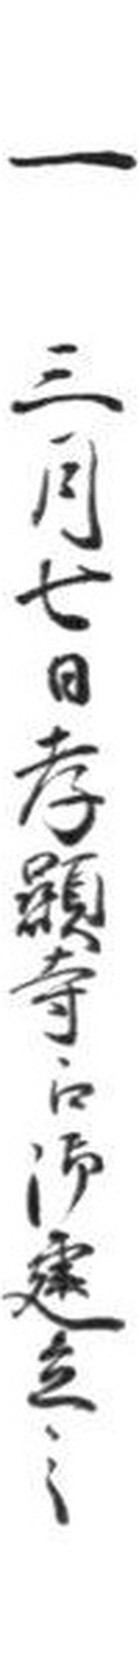一三月七日孝顕寺江御建立之
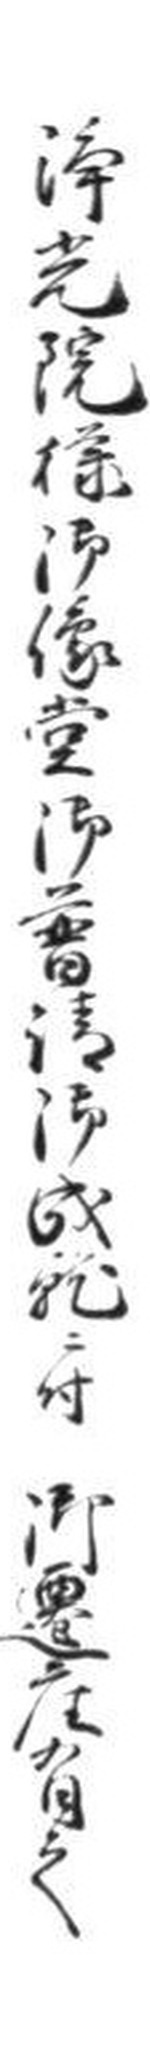浄光院様御像堂御普請御成就ニ付御遷座有之
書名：家譜 十七 吉品公 従元禄元年到同二年
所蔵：福井県文書館 Fukui Prefectural Archives
